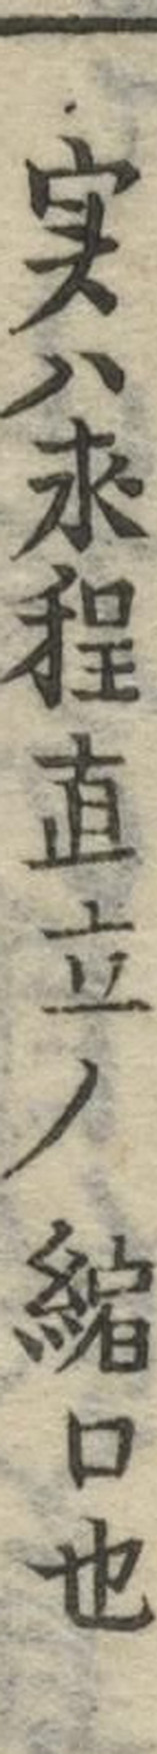実ハ求程直立ノ縮口也
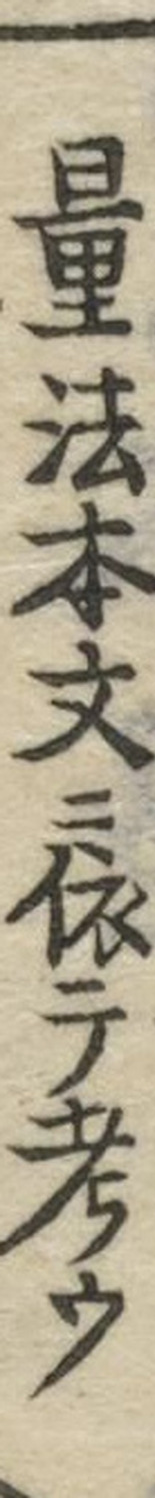量法本文ニ依テ考ウ
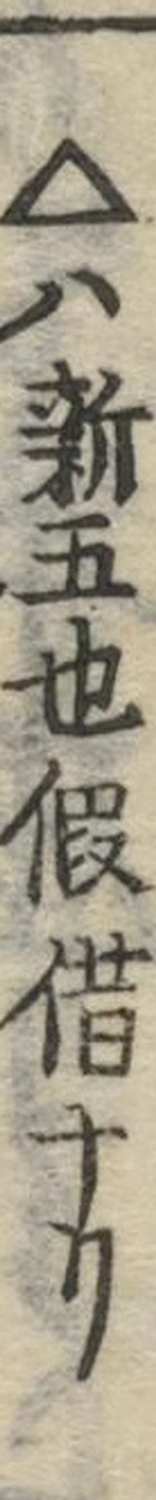△ハ新五也仮借ナリ

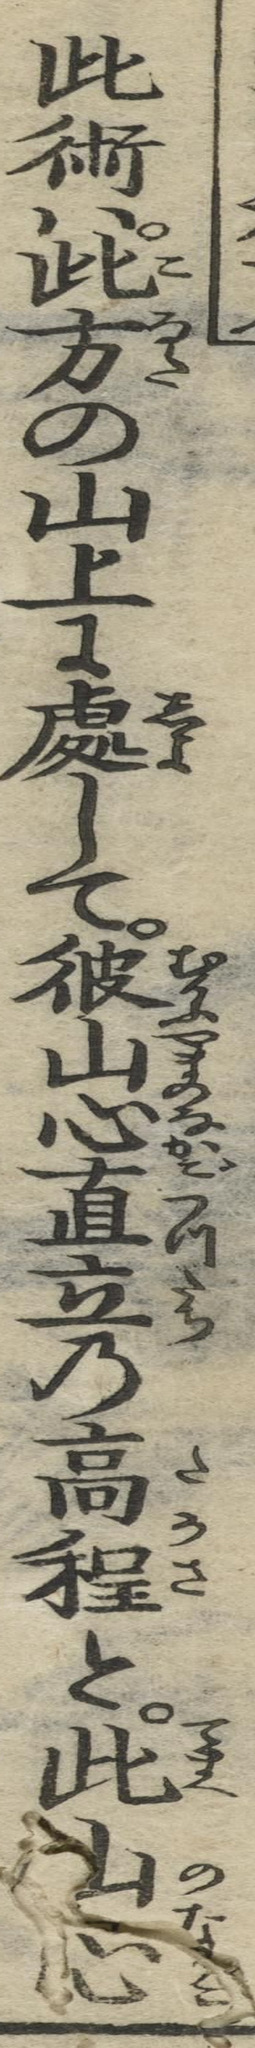此術は。此方の山上に処して。彼山心直立の高程と。此山心
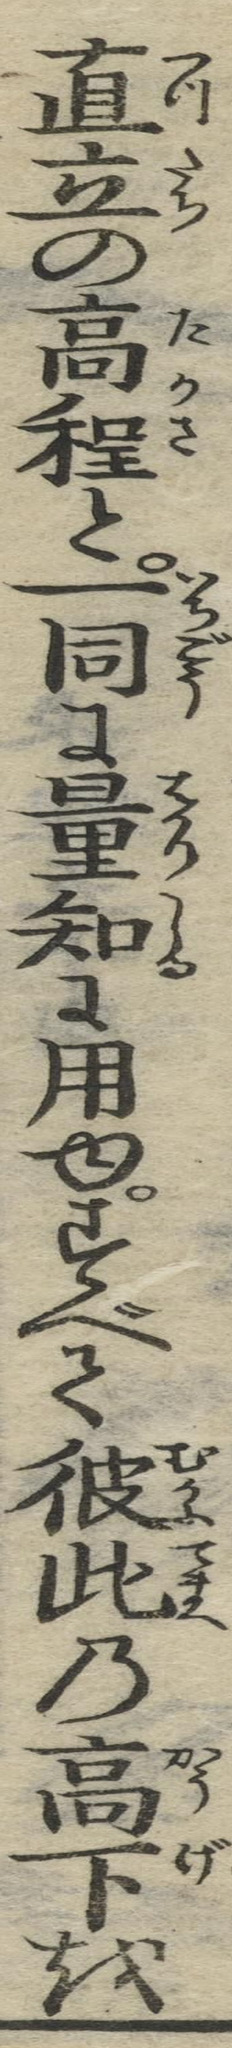直立の高程と。一同に量知に用ゆ。すべて彼此の高下を
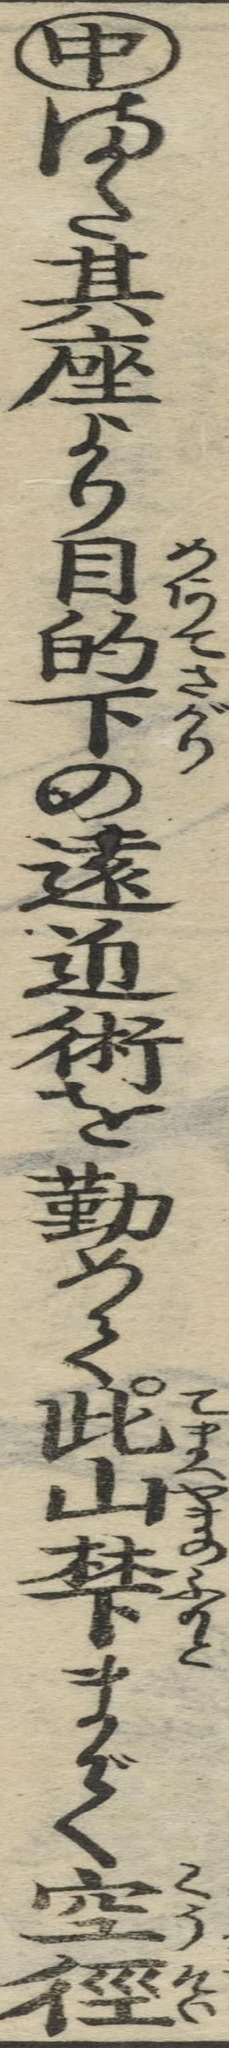中また其座より目的下の遠近術を勤めて。此山麓まで空径
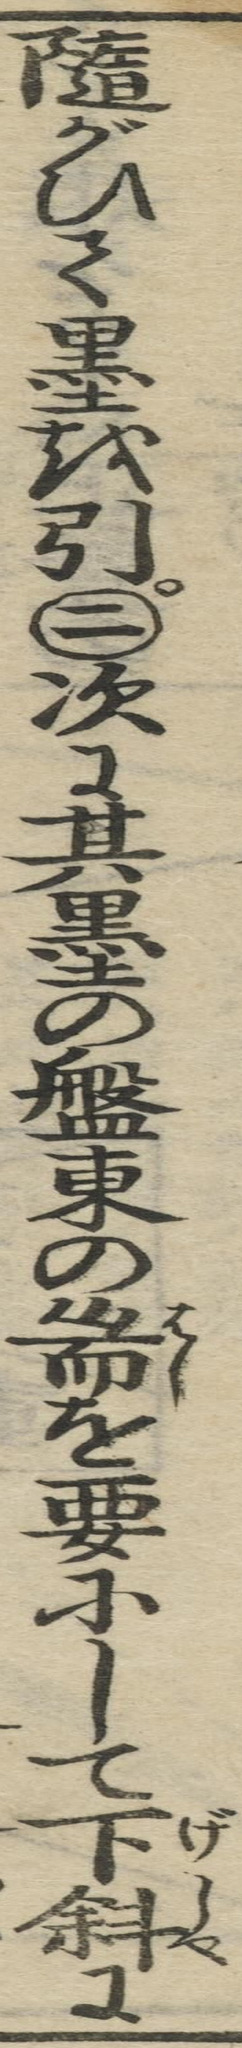随がひて墨を引。㊁次に其墨の盤東の端を要にして下斜に
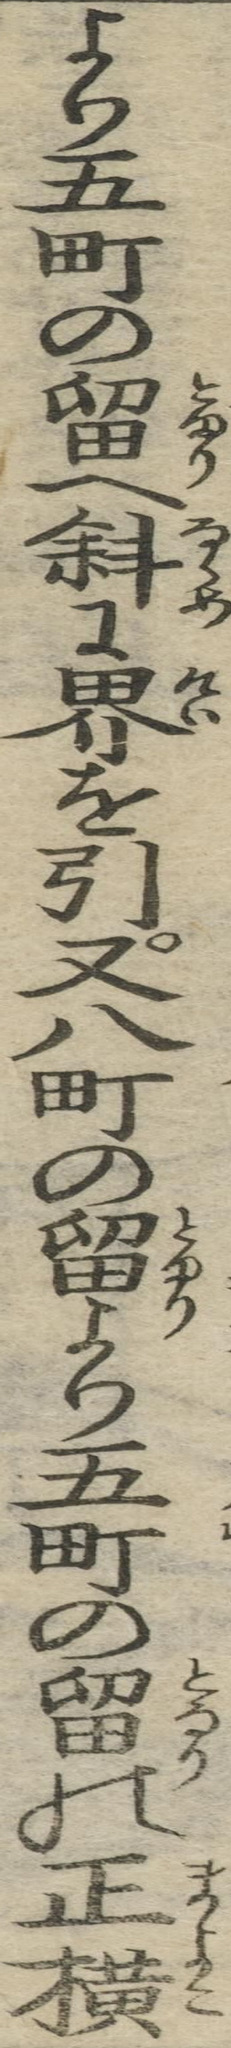より五町の留へ斜に界を引。又八町の留より五町の留の正横
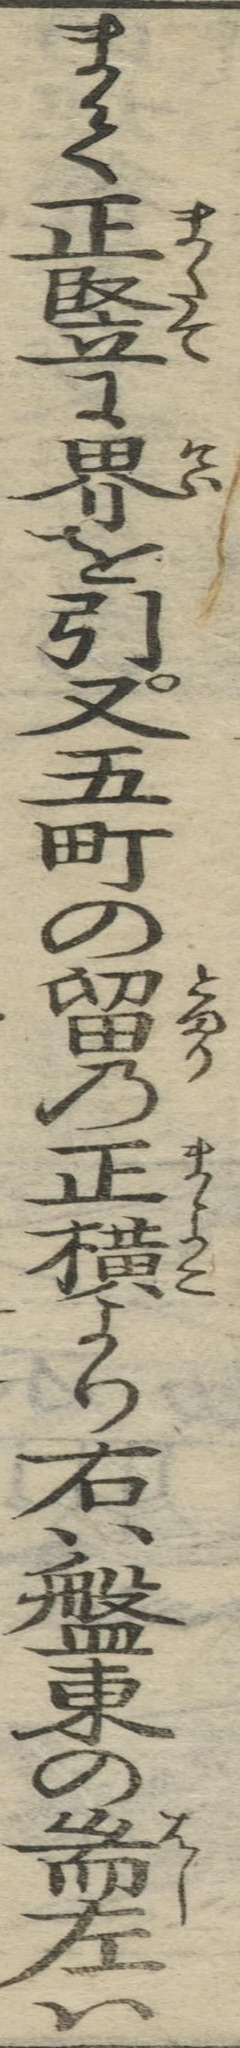まて正竪に界を引。又五町の留の正横より右は盤東の端左は
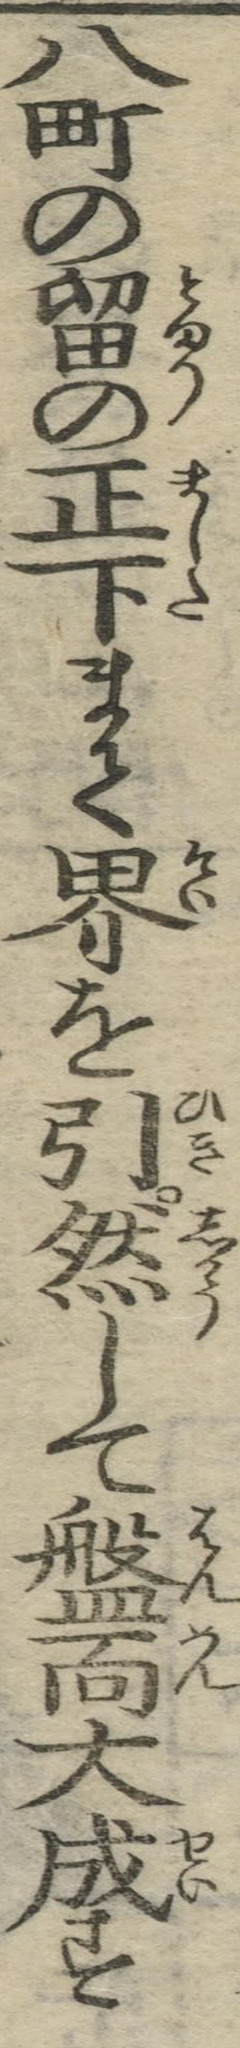八町の留の正下まて界を引。然して盤面大成す
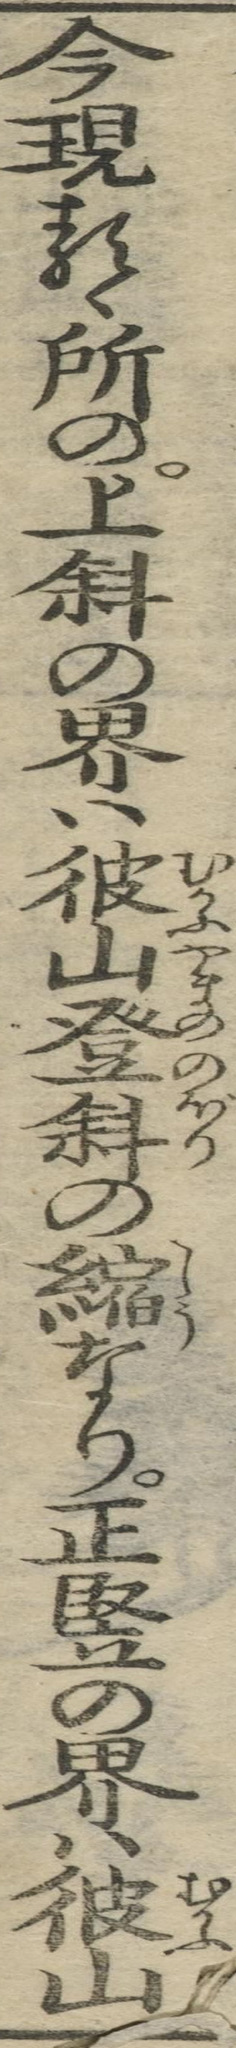今現るゝ所の。上斜の界は彼山登斜の縮なり。正竪の界は彼山

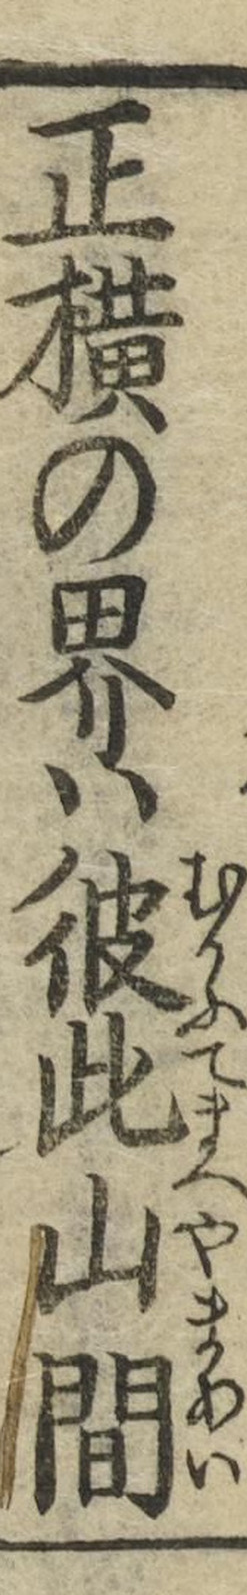正横の界は彼此山間
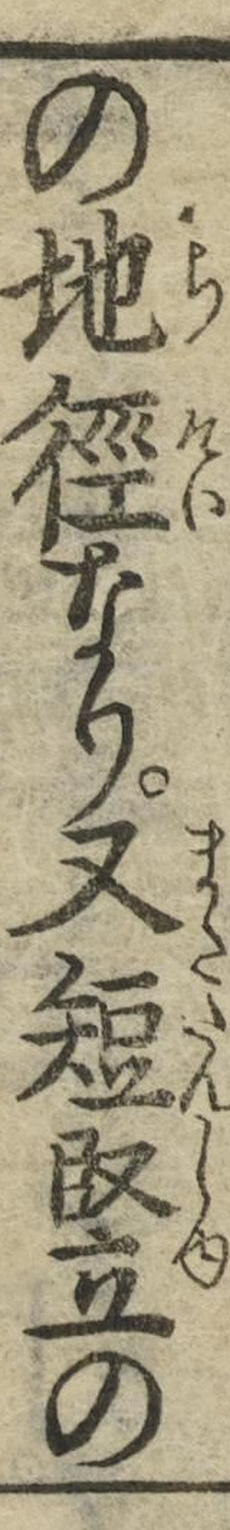の地径なり。又短竪の
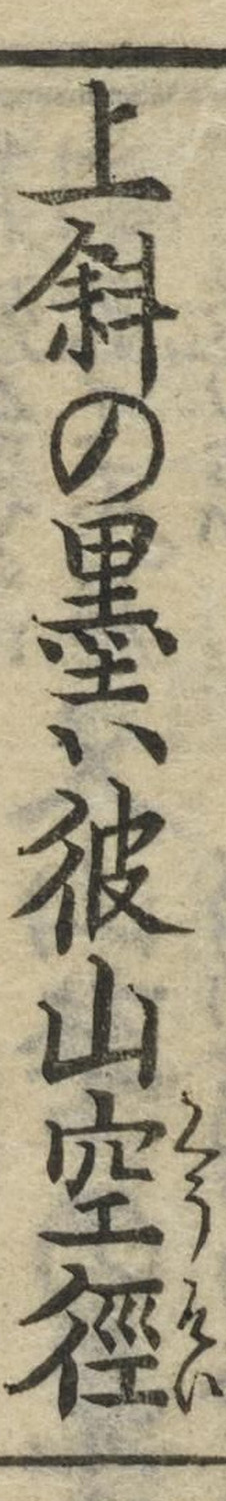上斜の墨は彼山空径
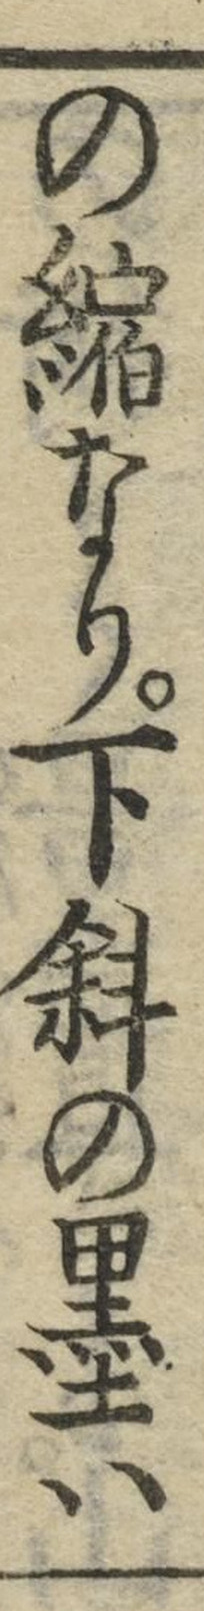の縮なり。下斜の墨は
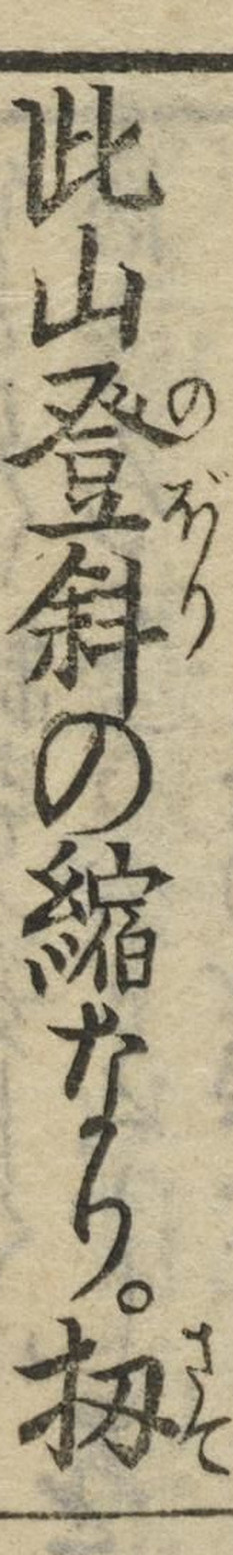此山登斜の縮なり。扨
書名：量地指南　巻之三（内題）
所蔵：東京大学地震研究所図書室 Earthquake Research Institute Library, The University of Tokyo, JAPAN
